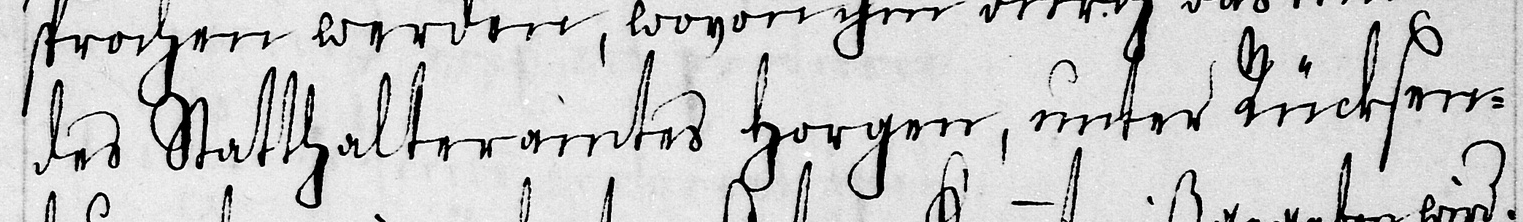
des Statthalteramtes Horgen, unter Rücksen¬
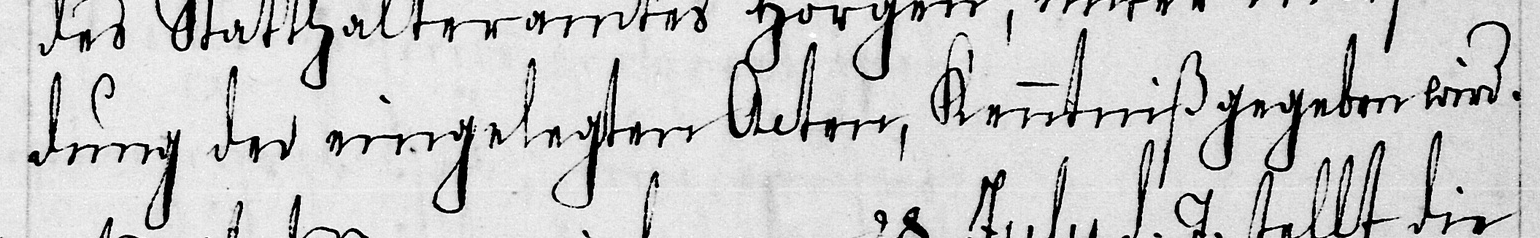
dung der eingelegten Acten, Kenntniß gegeben wird.
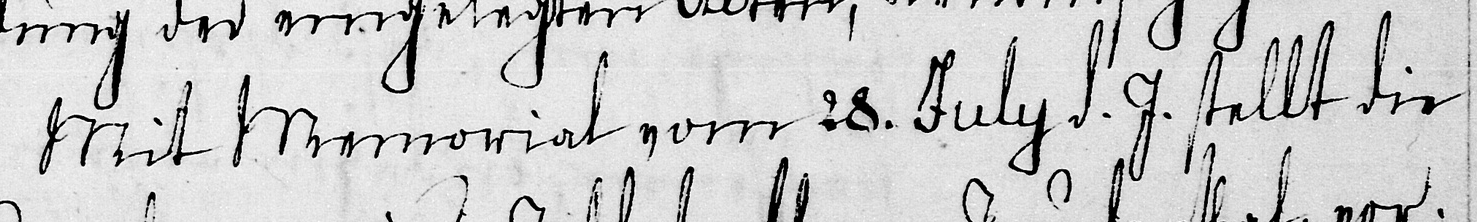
Mit Memorial vom 28. July d. J. stellt die
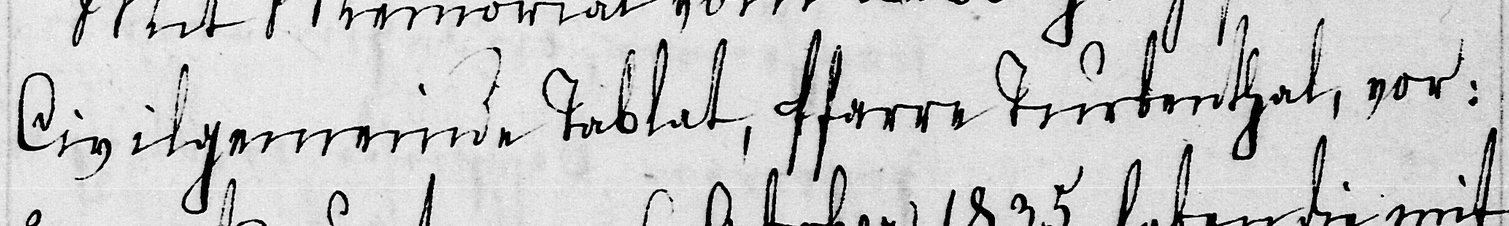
Civilgemeinde Tablat, Pfarre Turbenthal, vor:
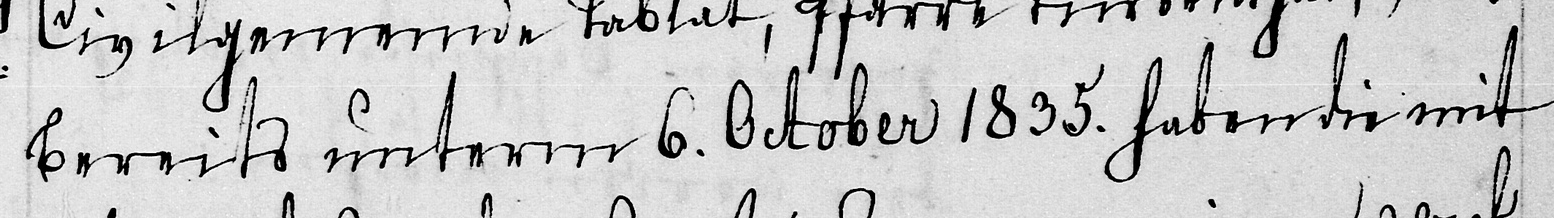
Bereits unterm 6. October 1835. haben die mit
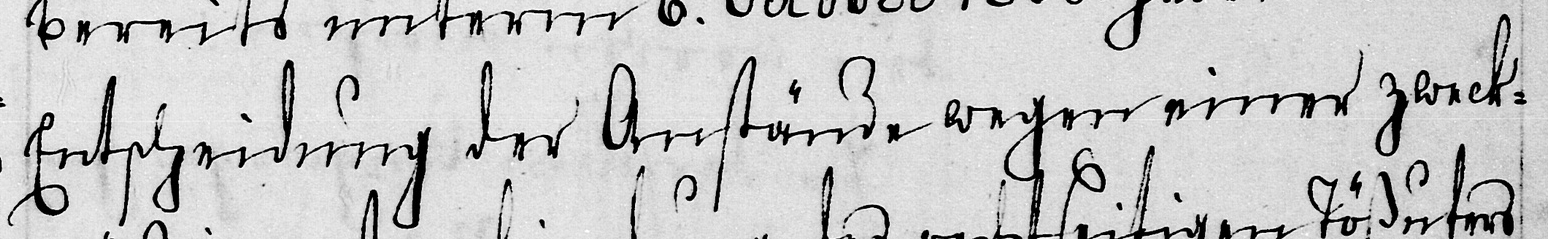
Entscheidung der Anstände wegen einer zweck¬
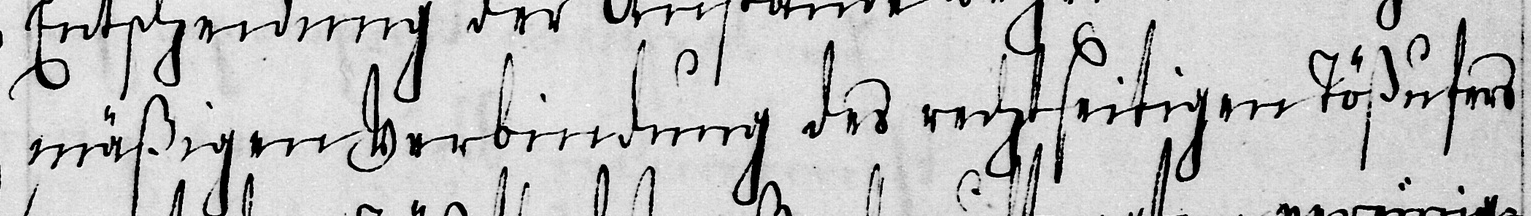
mäßigen Verbindung des rechtseitigen Tößufers
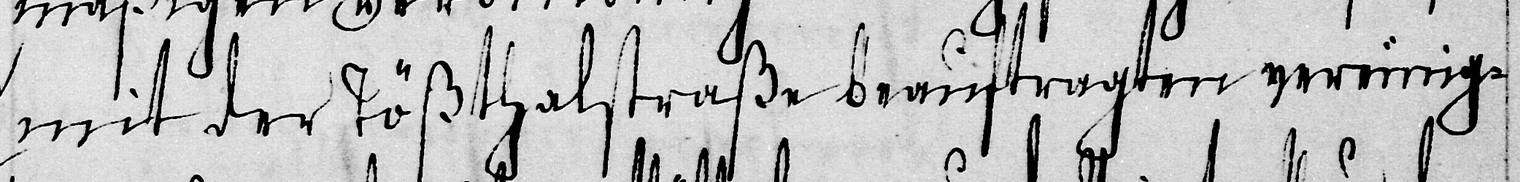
mit der Tößthalstraße beauftragten vereinig¬
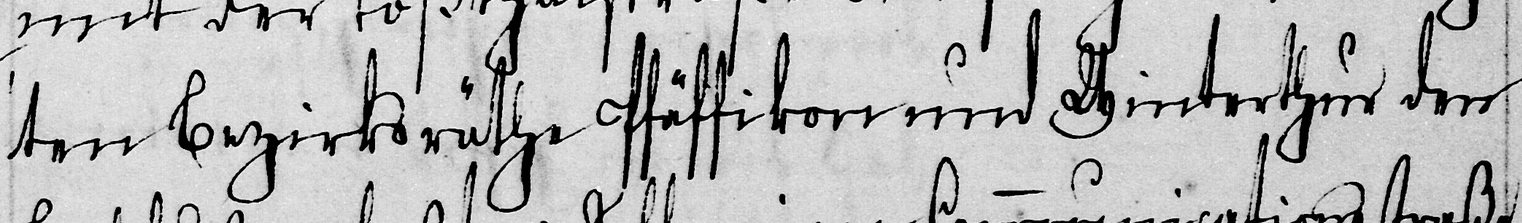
ten Bezirksräthe Pfäffikon und Winterthur den
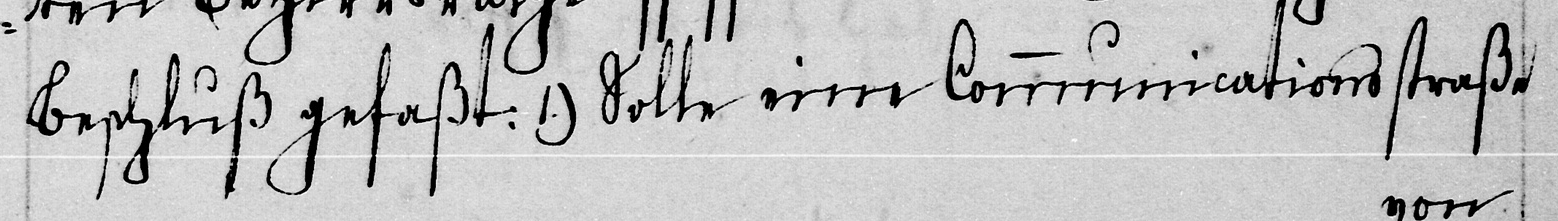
Beschluß gefaßt: 1.) Solle eine Communicationsstraße
